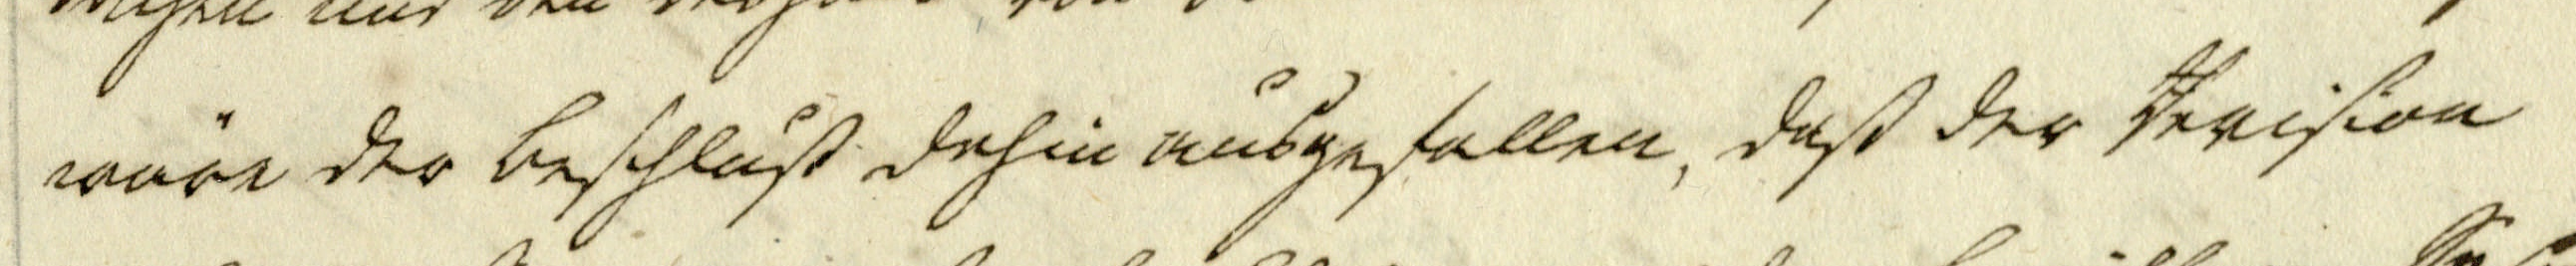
wäre der Beschluß dahin ausgefallen, daß der Revision
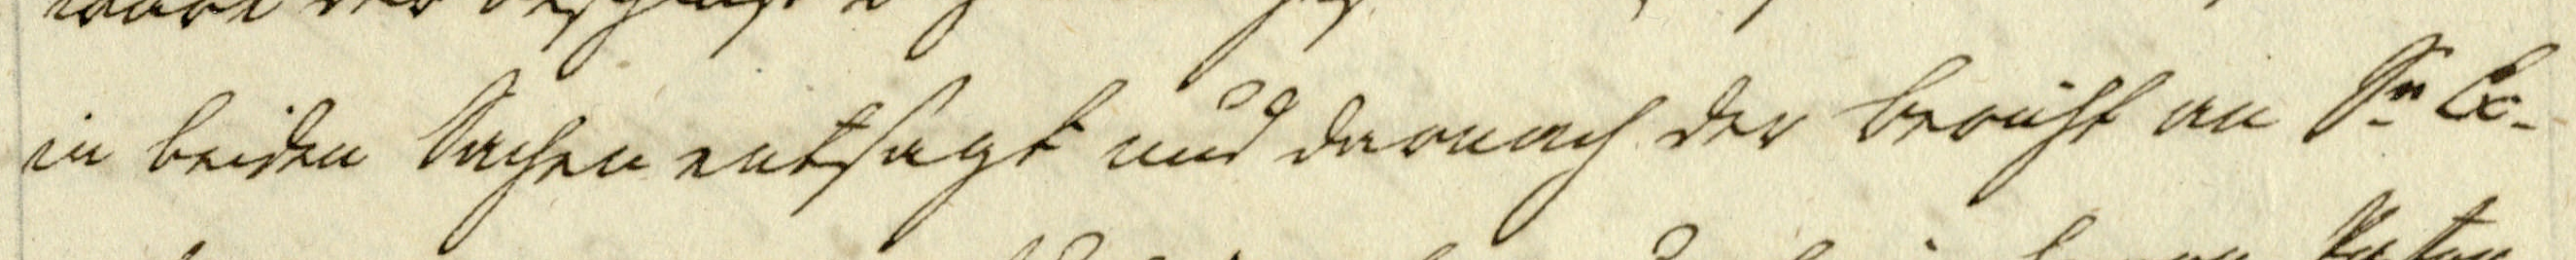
in beiden Sachen entsagt und darnach der Bericht an Sr. Ex¬
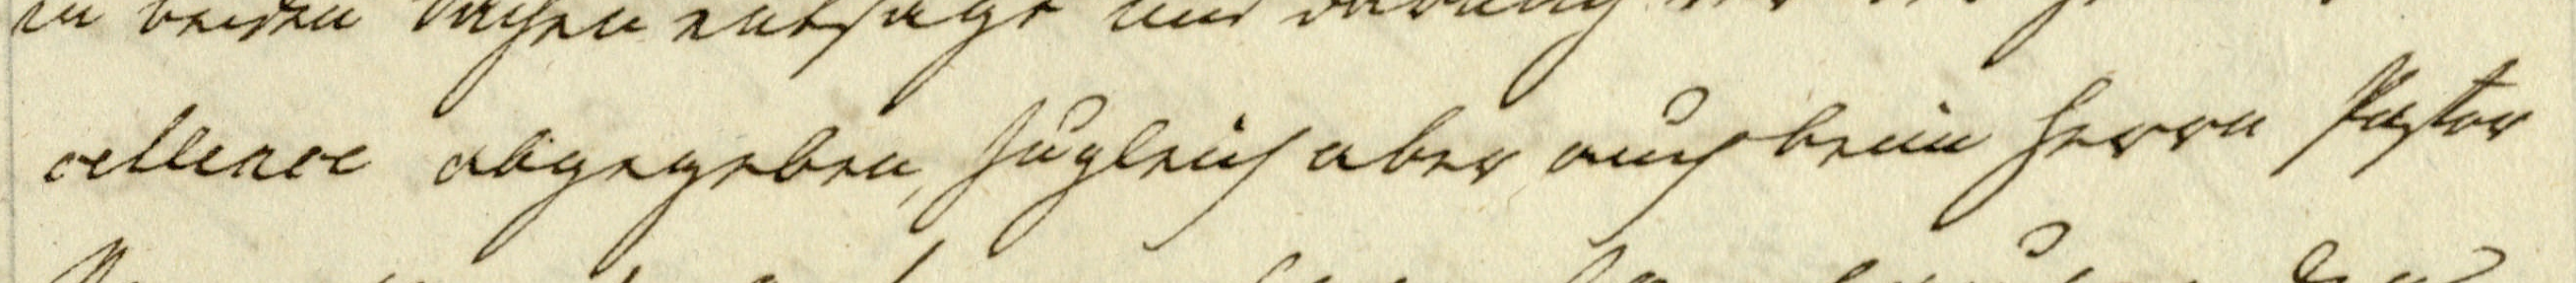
cellence abgegeben, zugleich aber auch beim herrn Pastor
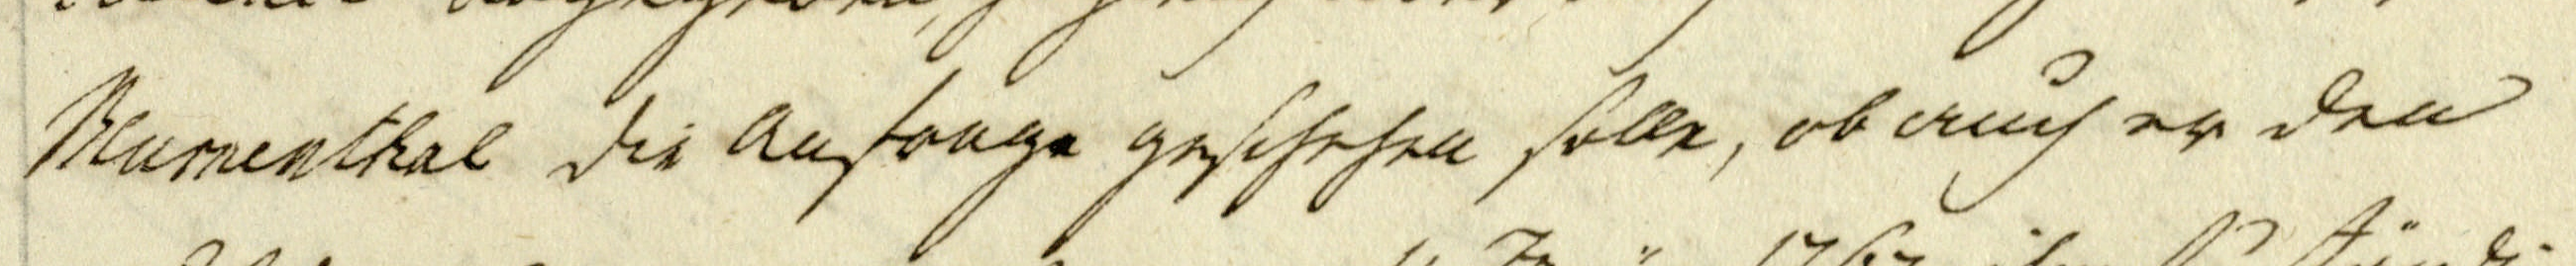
Blumenthal die Anfrage geschehen solle, ob auch er den
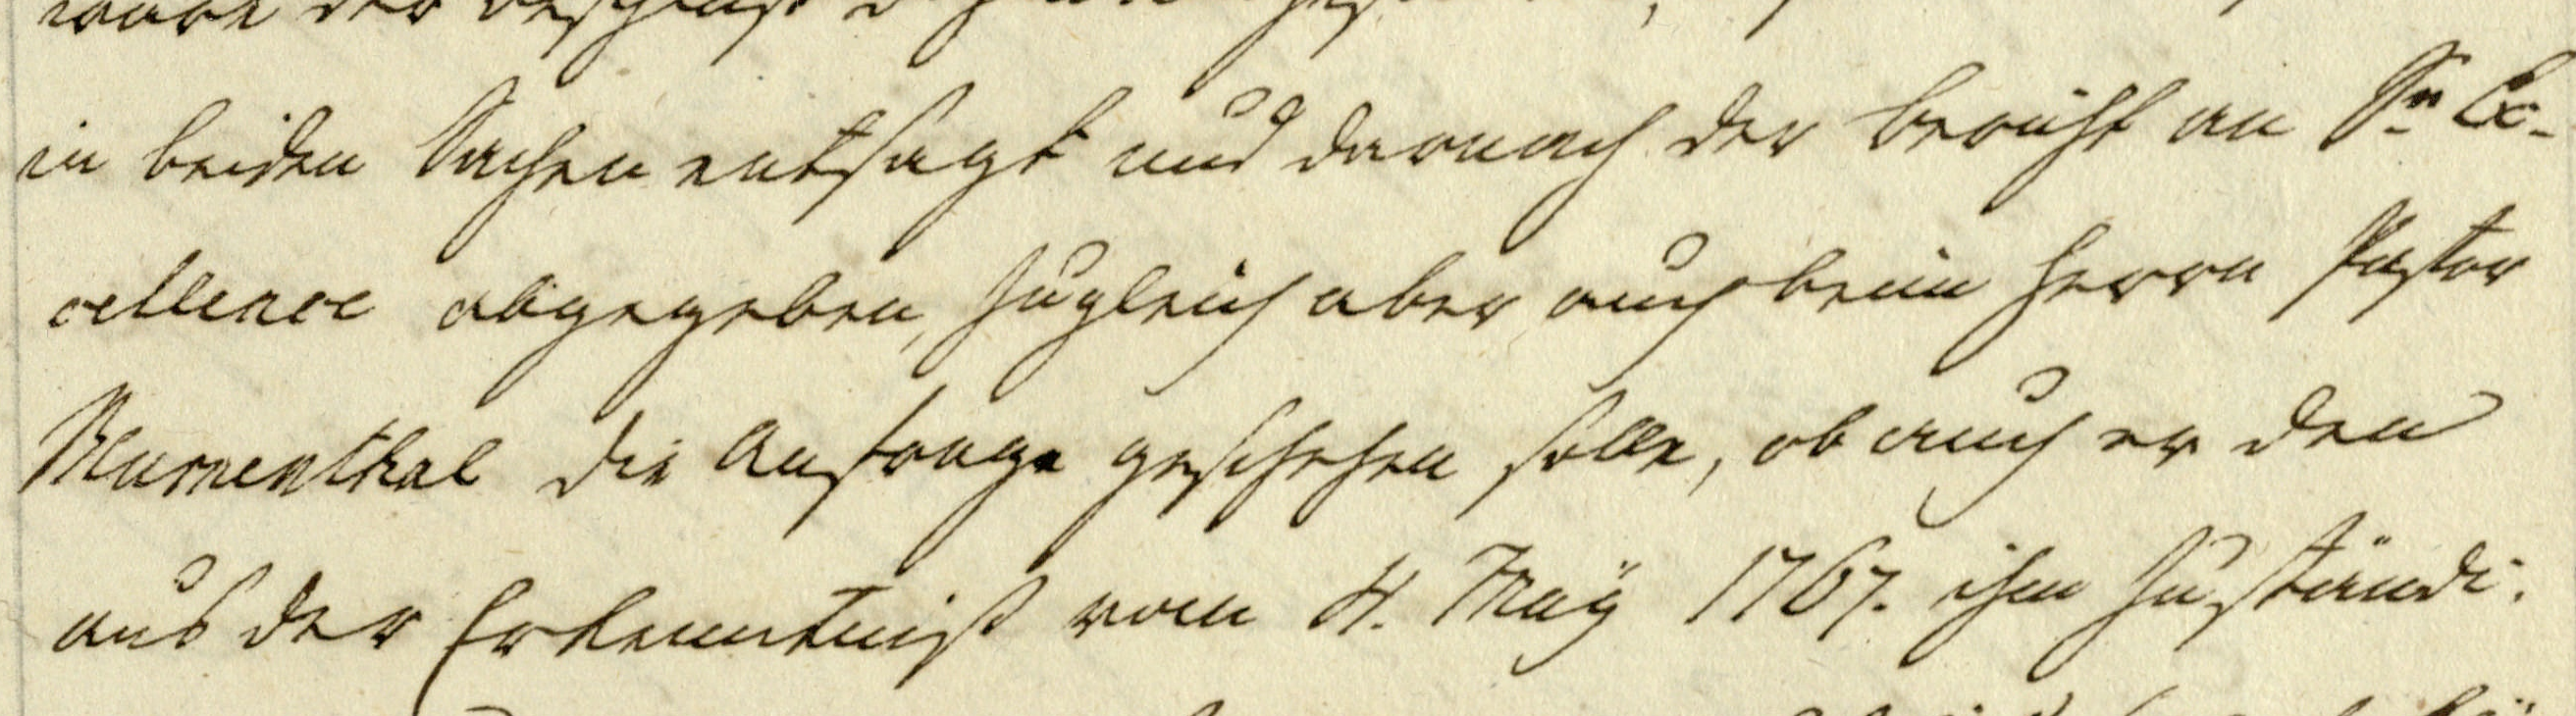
aus der Erkenntniß vom 4. Maÿ 1767. ihm zuständi¬
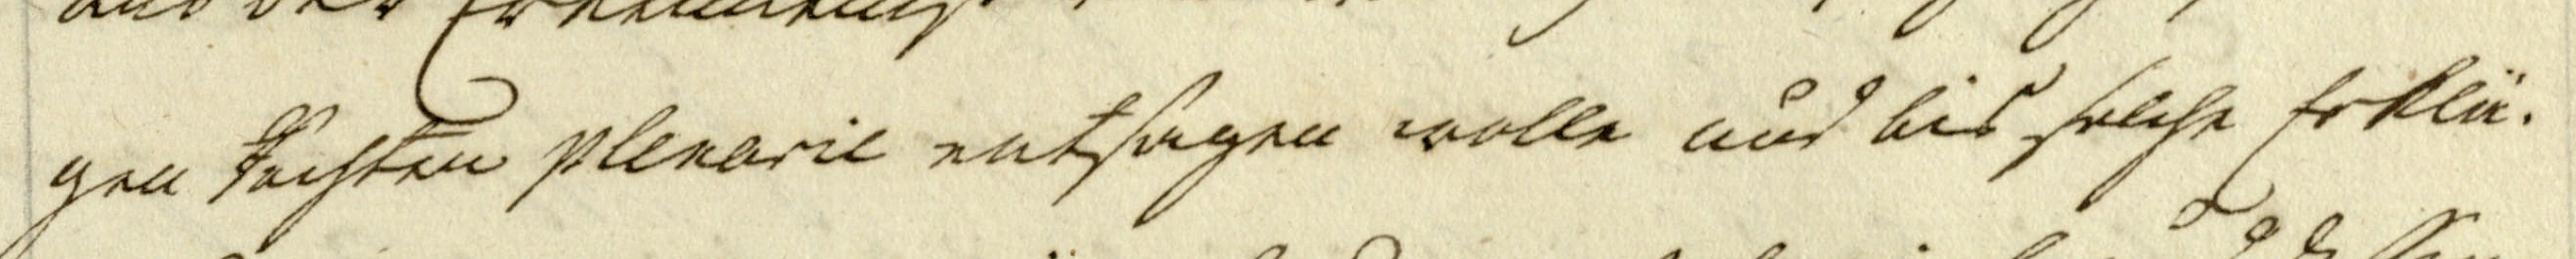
gen Rechten plenarie entsagen wolle und bis solche Erklä¬
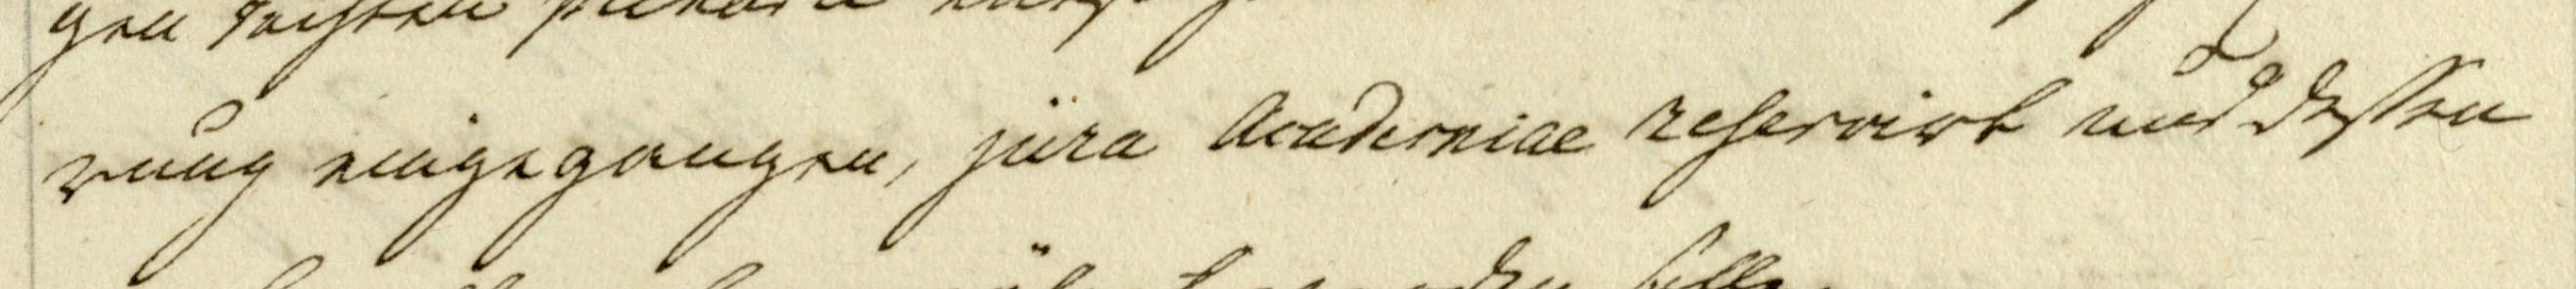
rung eingegangen, jura Academiae reservirt und dessen
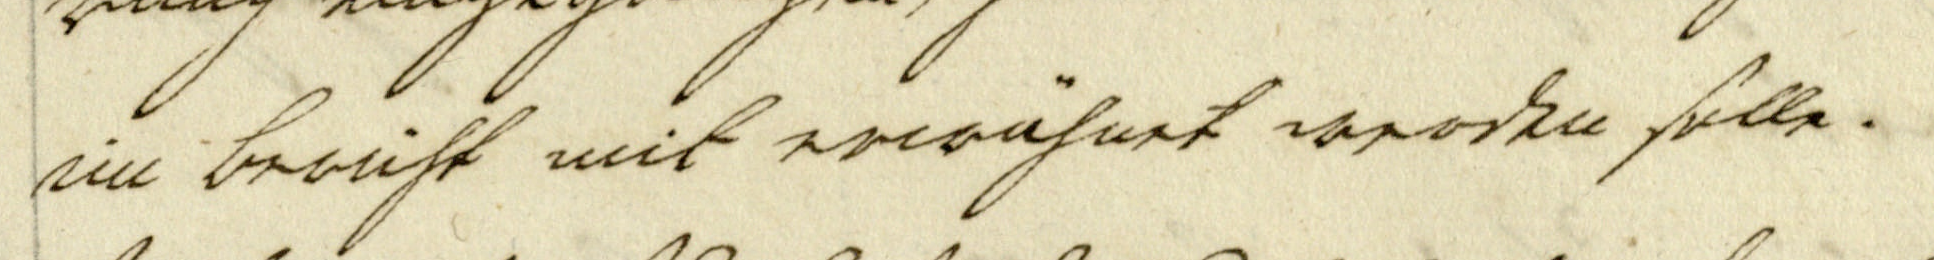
im Bericht mit erwähnet werden solle.
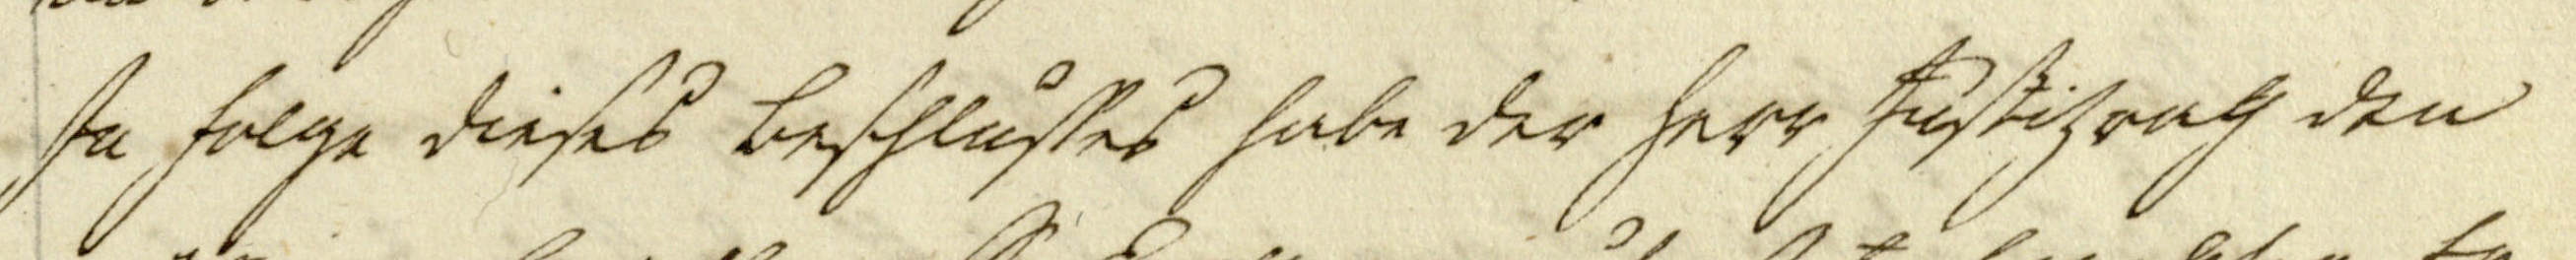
In Folge dieses Beschlusses habe der Herr Justizrath den
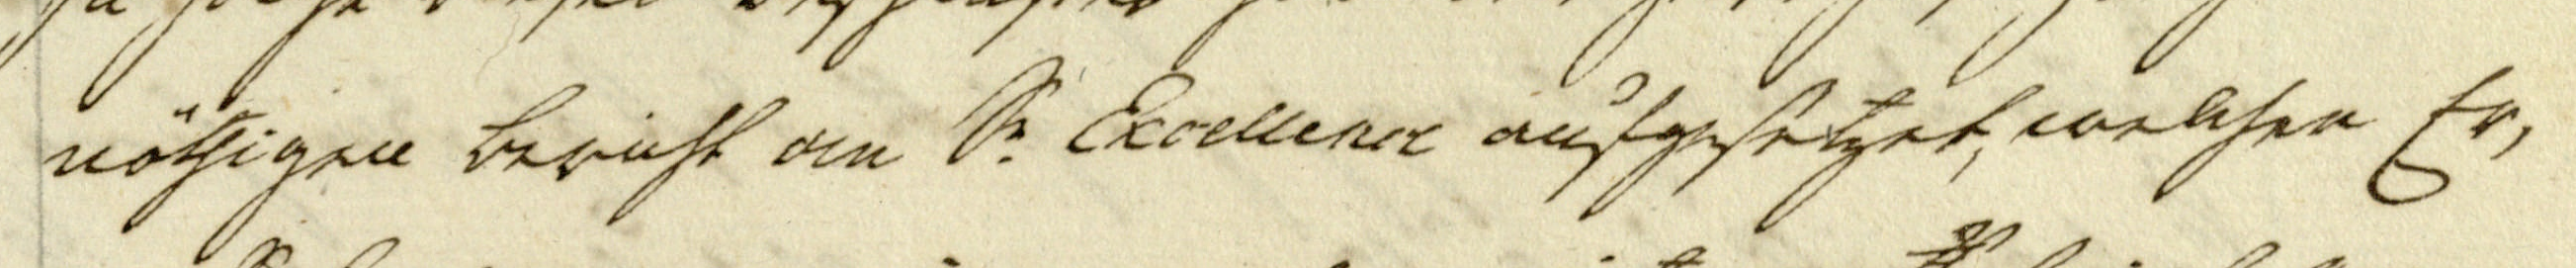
nöthigen Bericht an Sr. Excellence aufgesetzet, welchen Er
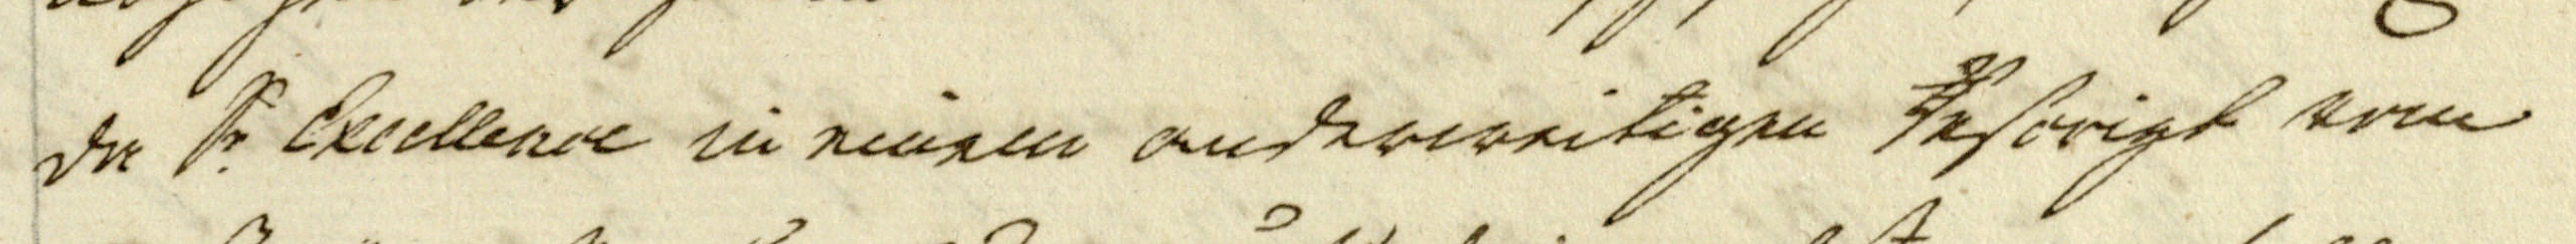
da Sr. Excellence in einem anderweitigen Rescript vom
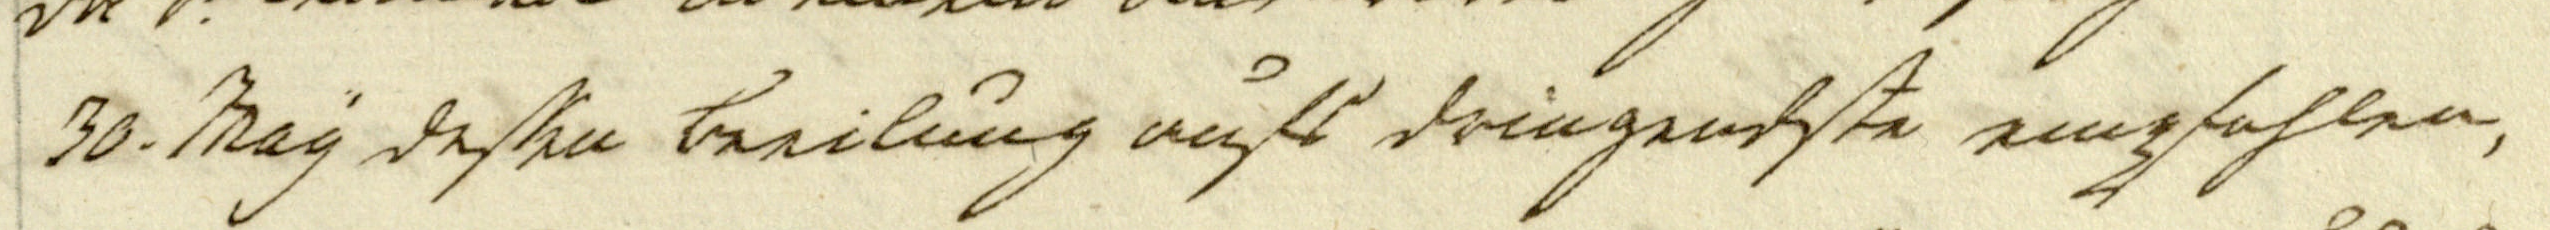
30. Maÿ dessen Beeilung aufs dringendste empfehlen,
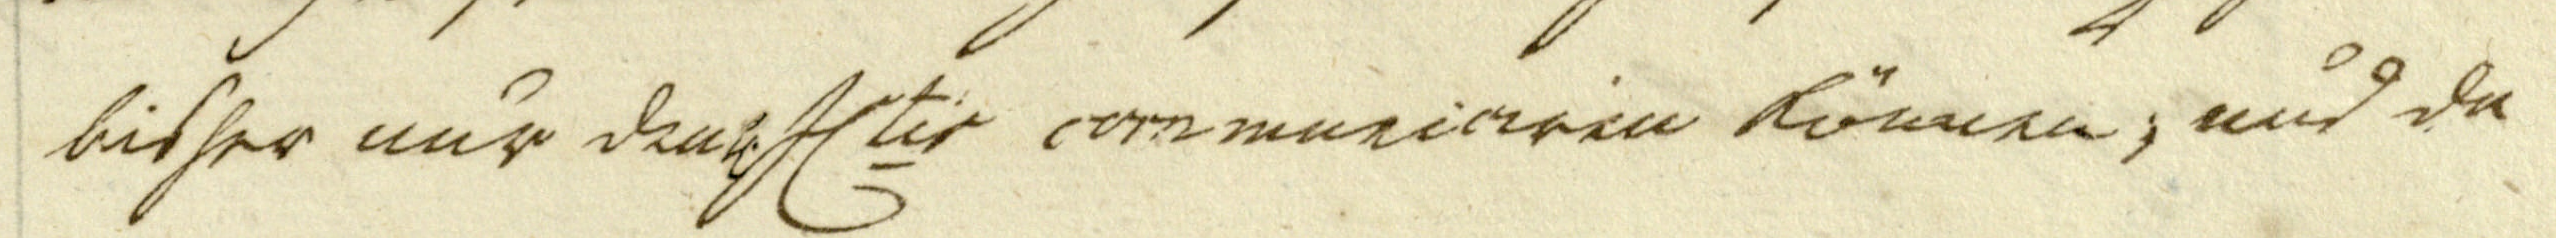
bisher nur den h Il tis communiciren können, und da
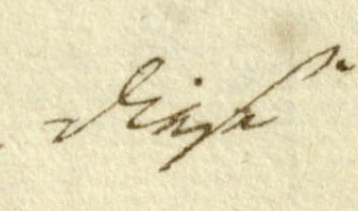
diese
